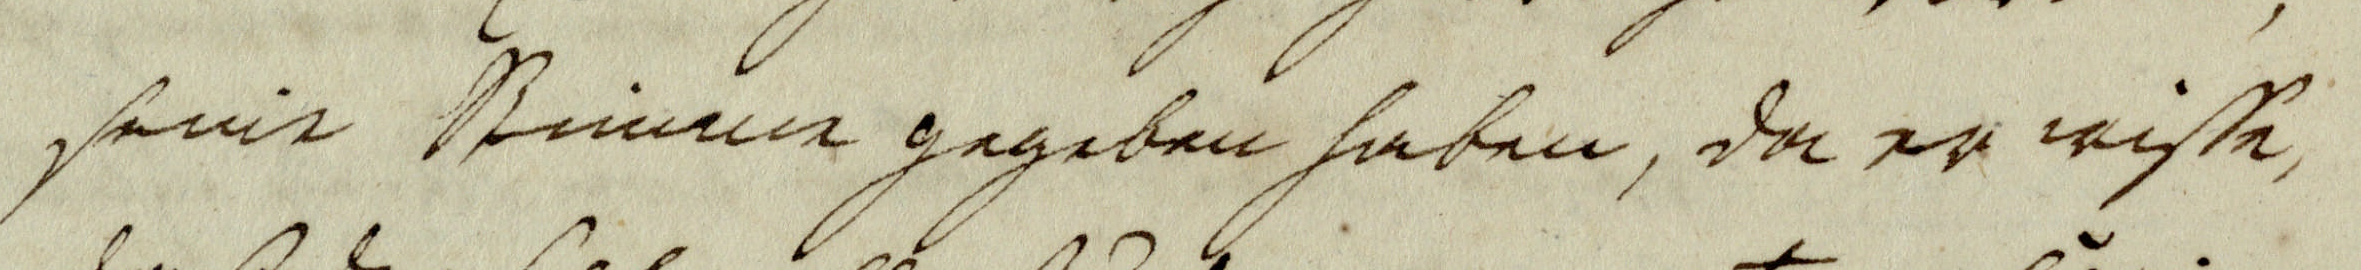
seine Stimme gegeben haben, da er wisse,
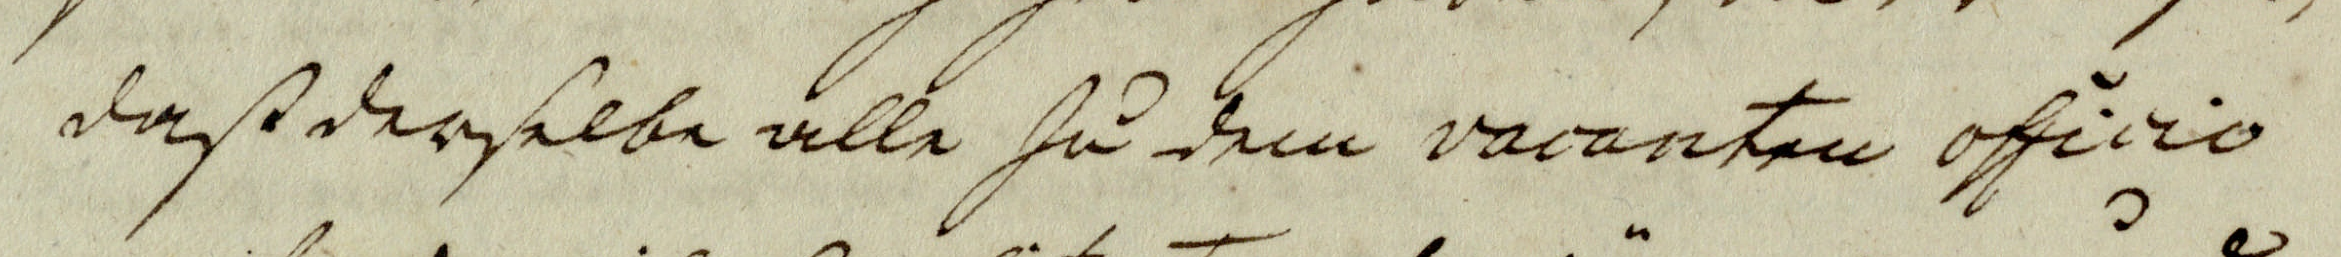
daß derselbe alle zu dem vacanten officio
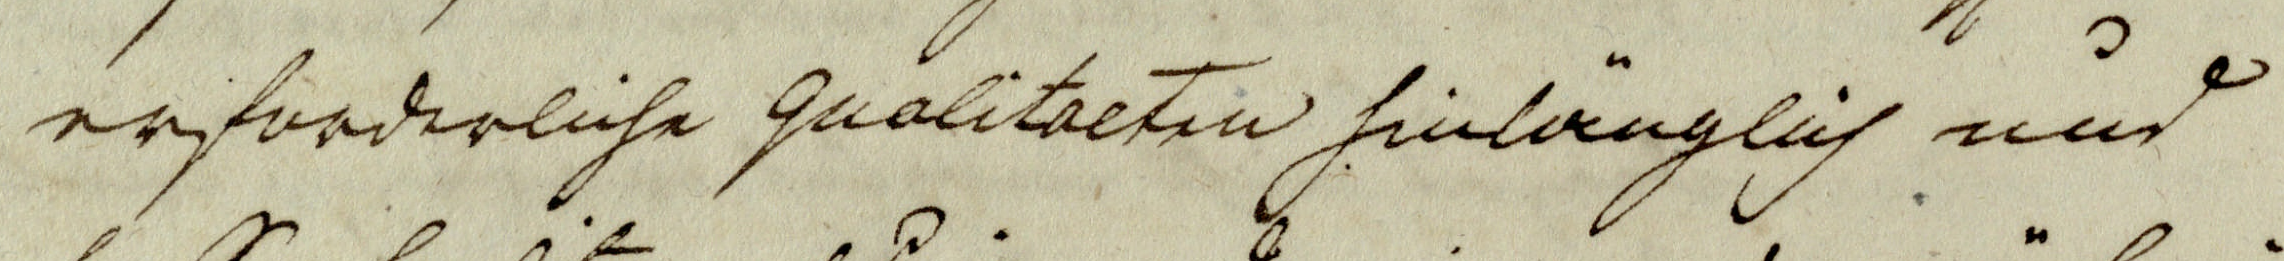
erforderliche Qualitaeten hinlänglich und
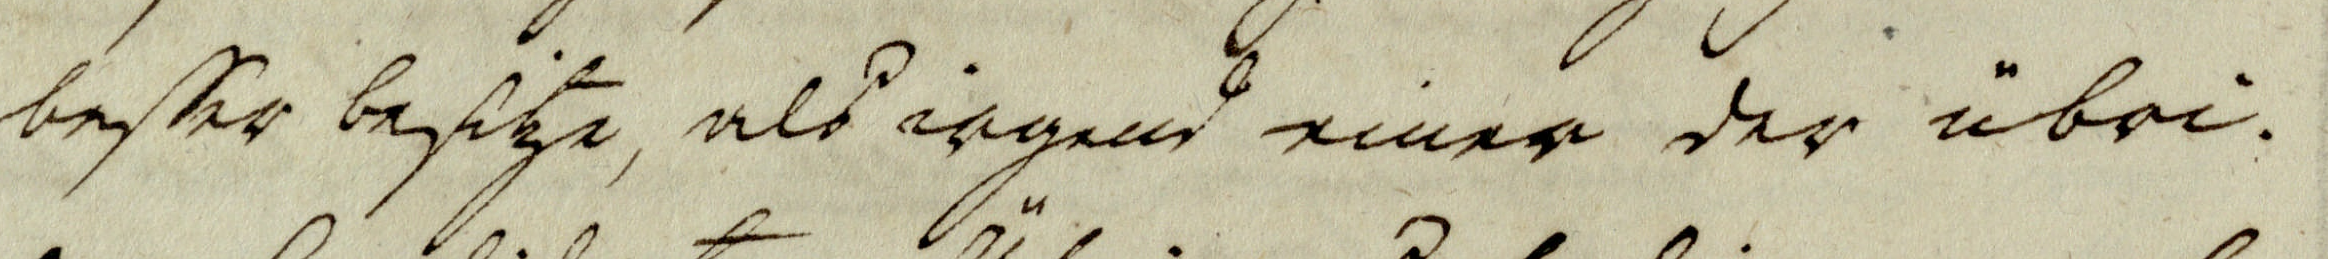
besser besitze, als irgend einer der übri¬
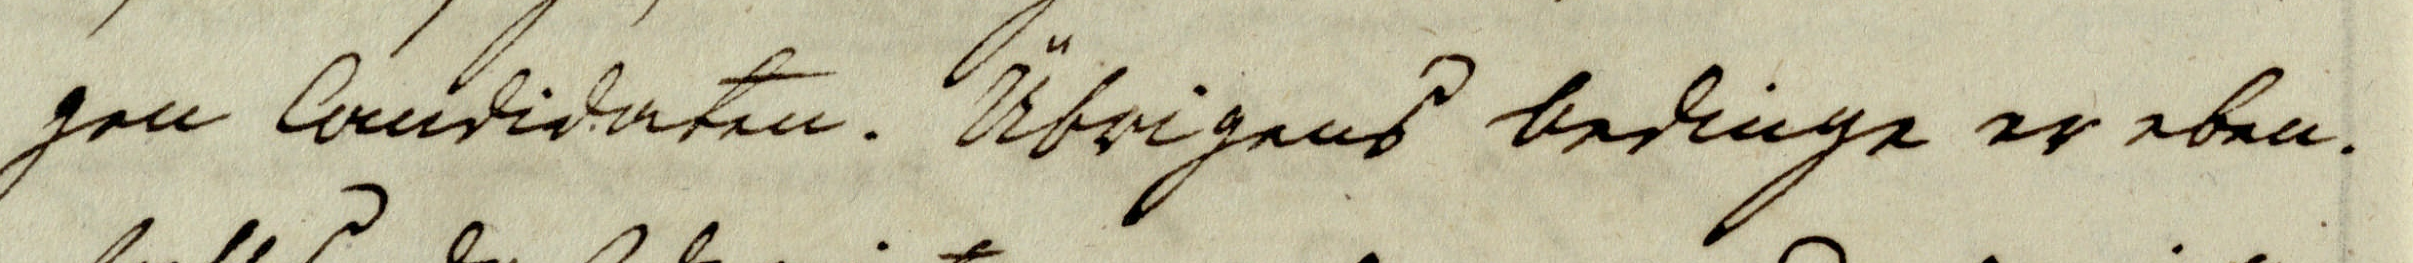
gen Candidaten. Übrigens bedinge er eben¬
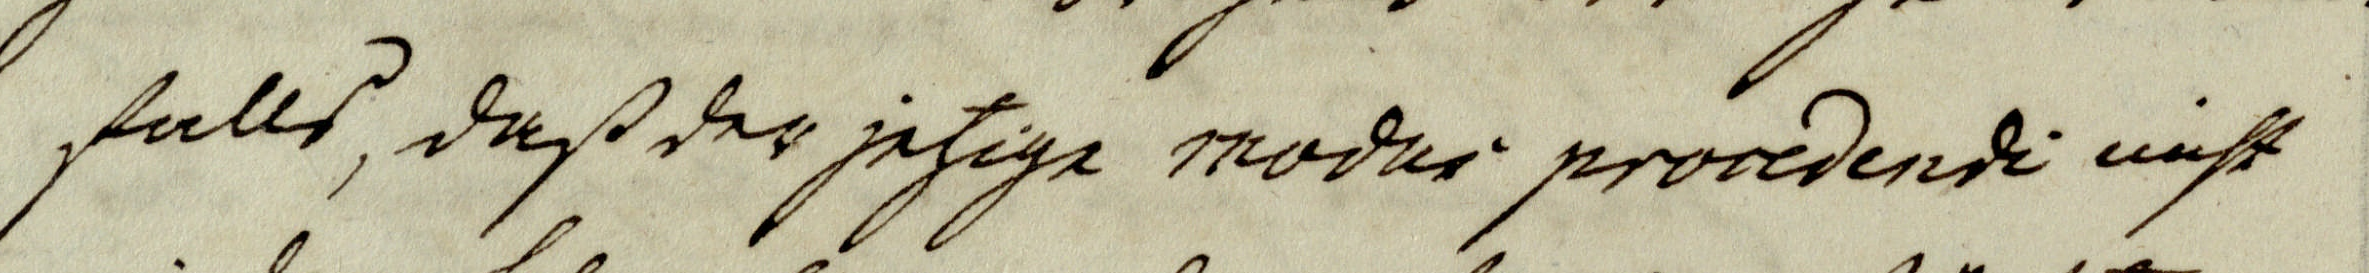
falls, daß der jetzige modus procedendi nicht
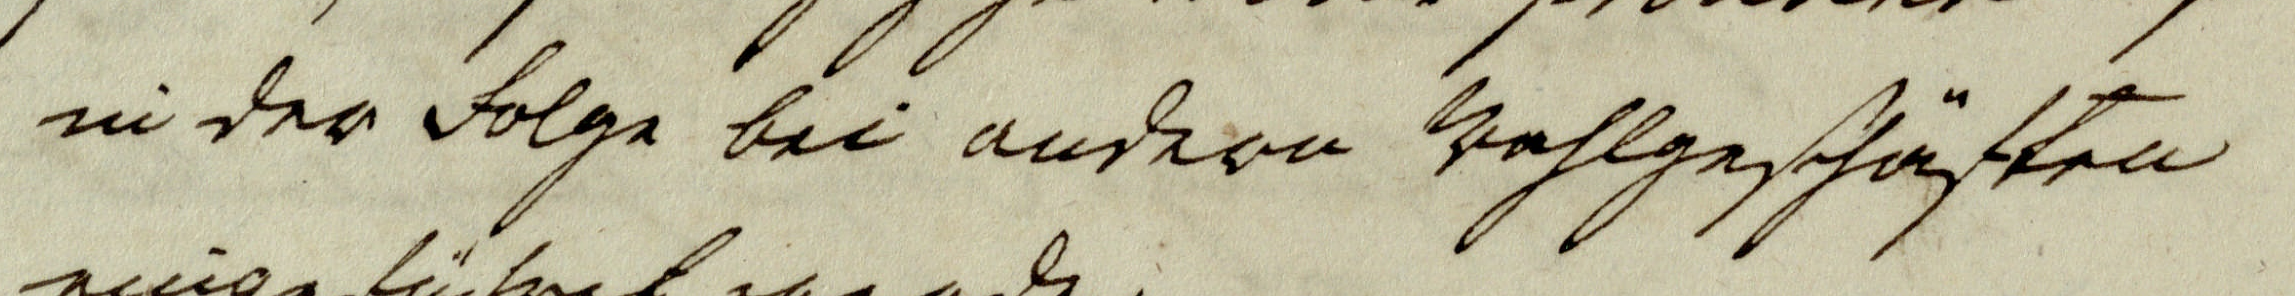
in der Folge bei andern Wahlgeschäften
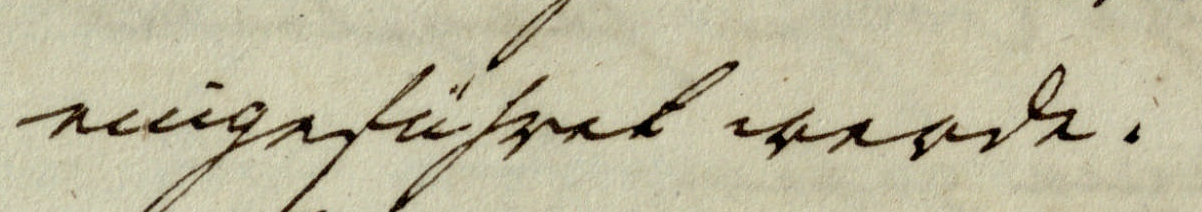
einngeführet werde.
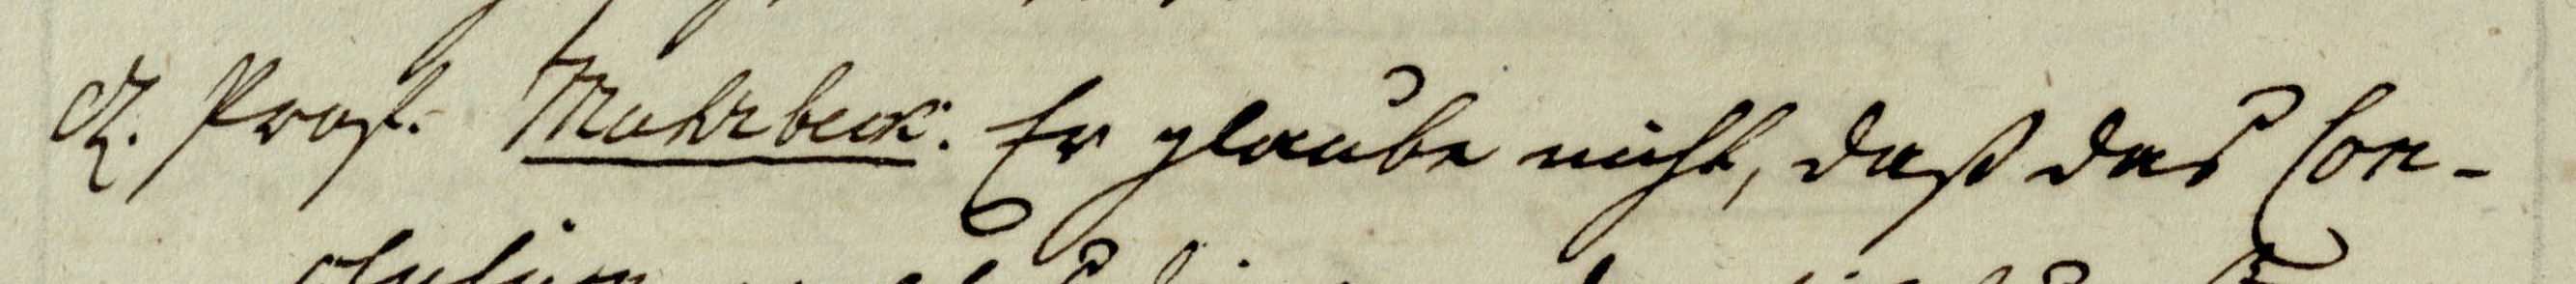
dh. Prof. Muhrbeck. Er glaube nicht, daß das Con¬
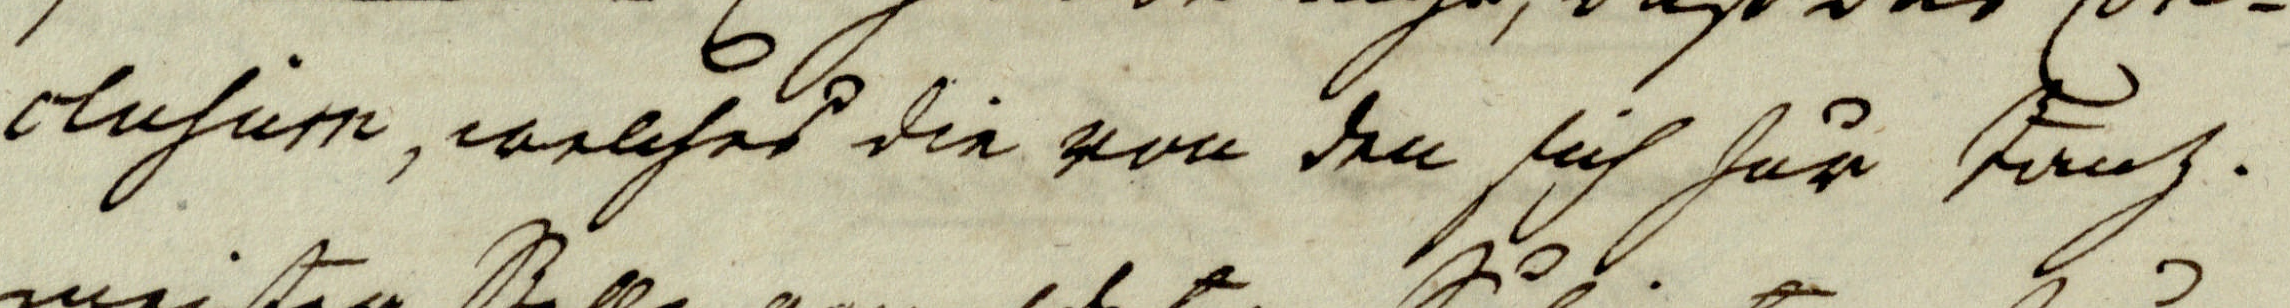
clusum, welches die von den sich zur Tanz¬
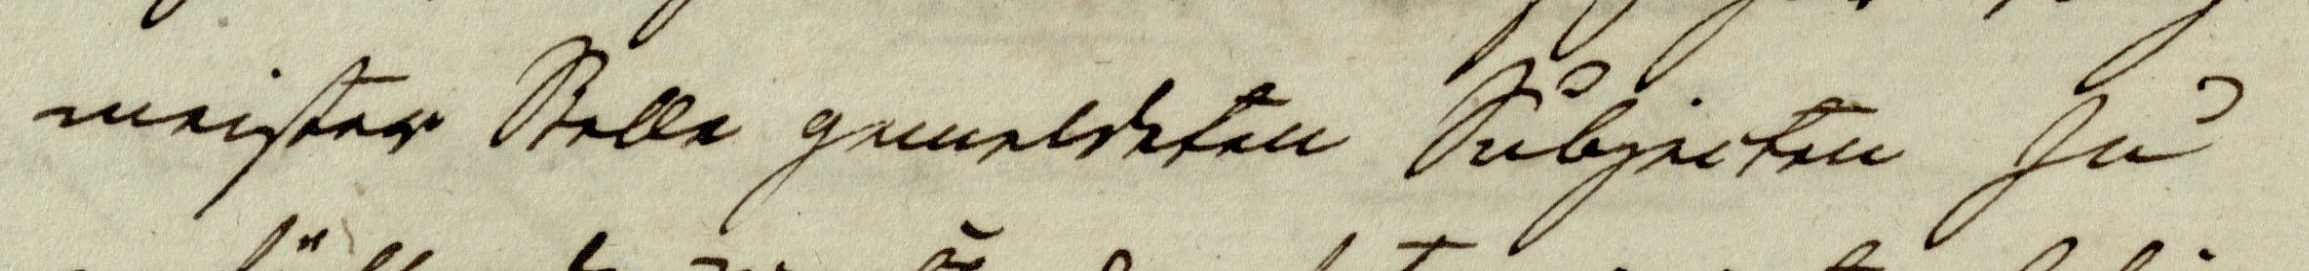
meister Stelle gemeldeten Subjecten zu
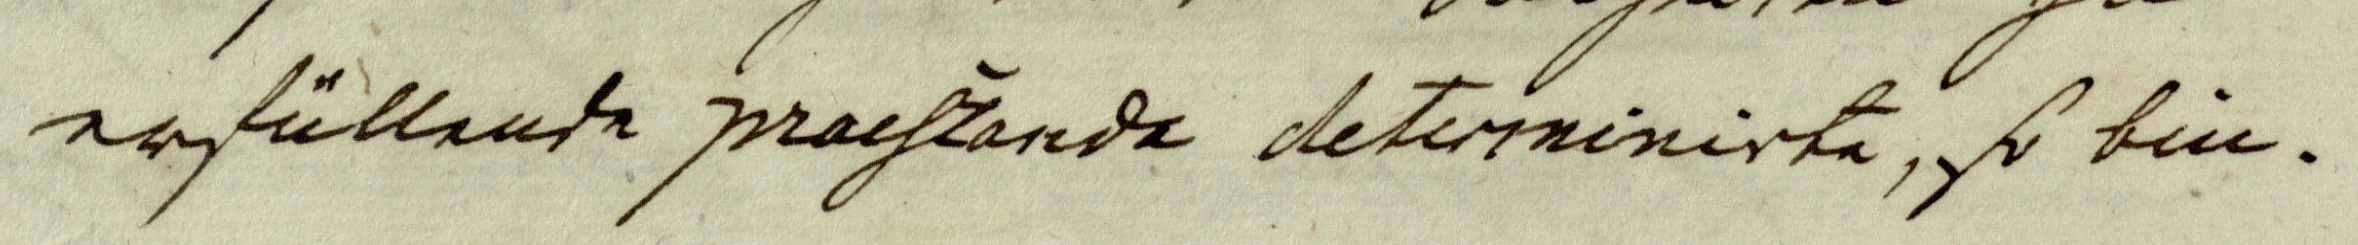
erfüllende praestanda determinirte, so bin¬
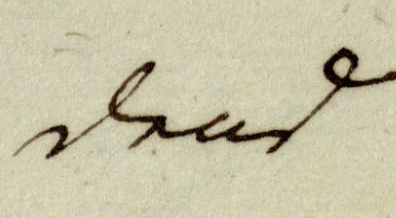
dend
